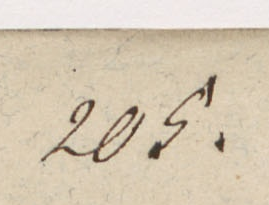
205.
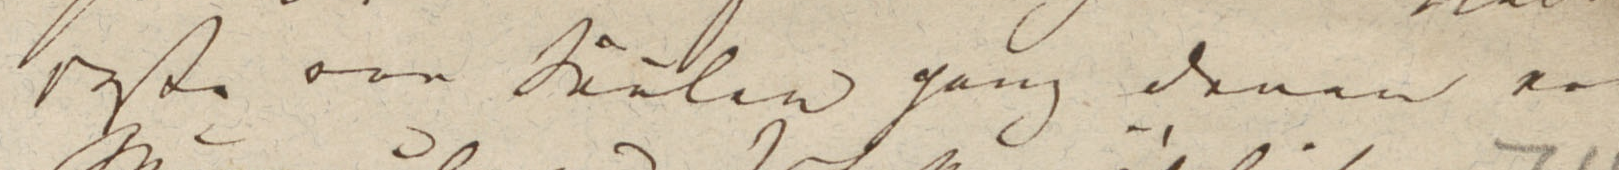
reste von Säulen ganz denen von
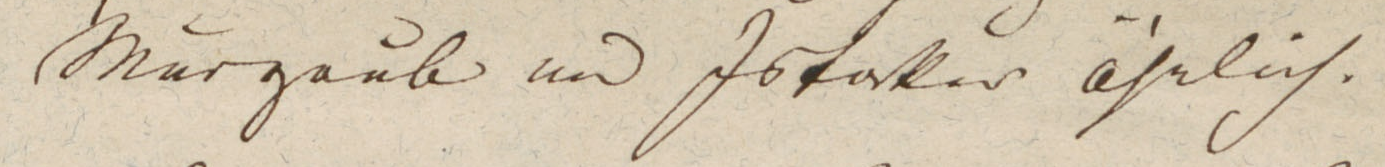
Murgaub und Istakes ähnlich.
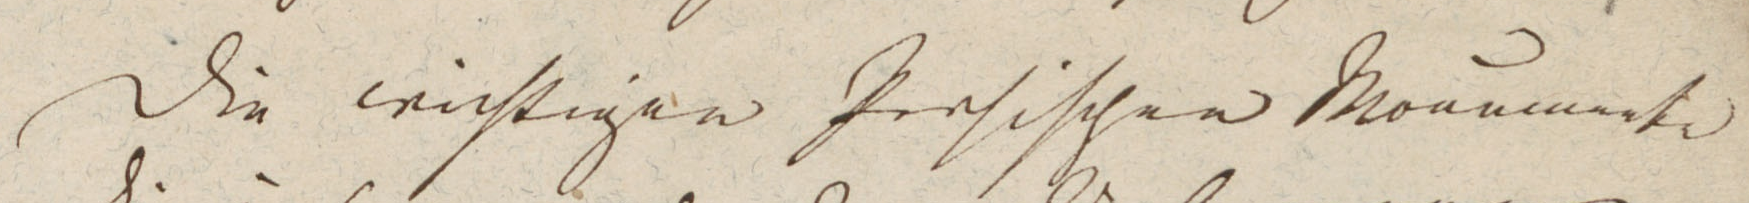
Die wichtigen Persischen Monumente
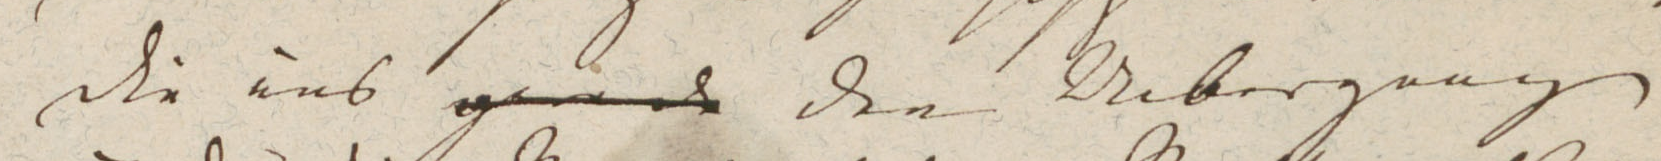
die uns gerade den Uebergang
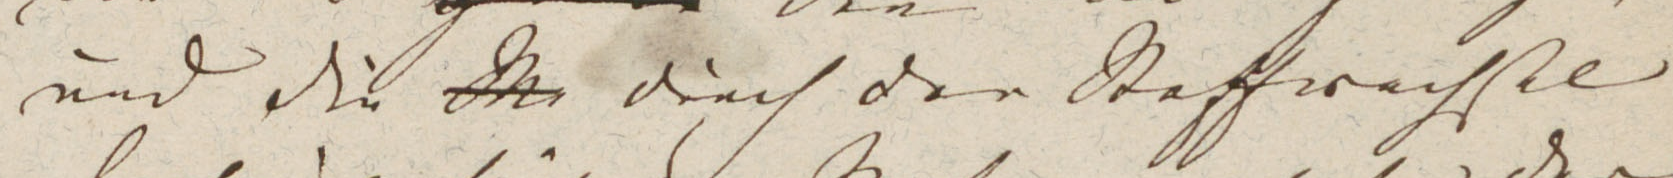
und die M durch den Stoffwechsel
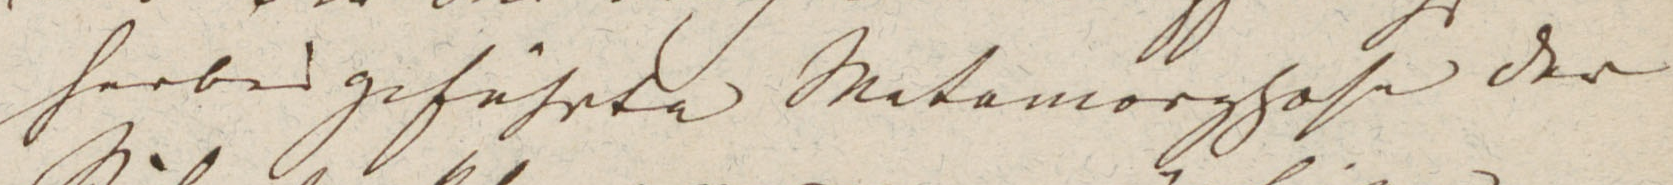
herbei geführte Metamorphose der
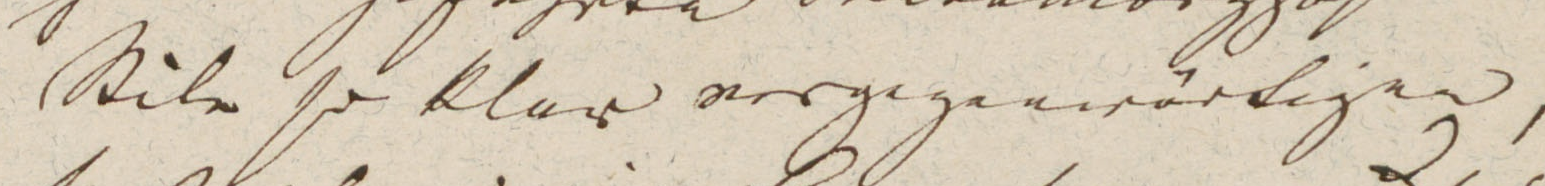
Stile so klar vergegenwärtigen,
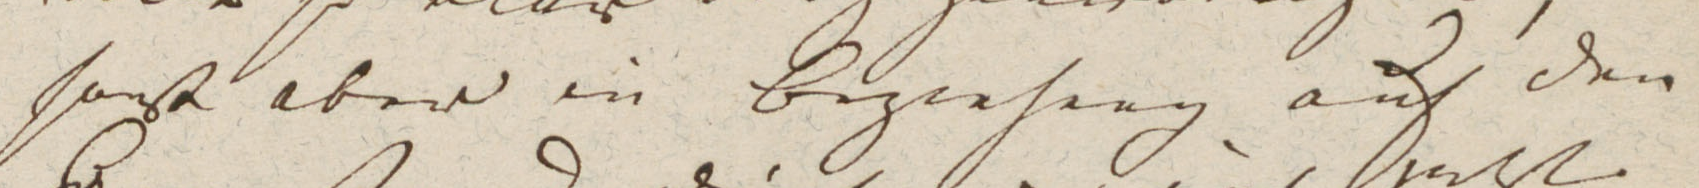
sonst aber in Beziehung auf den
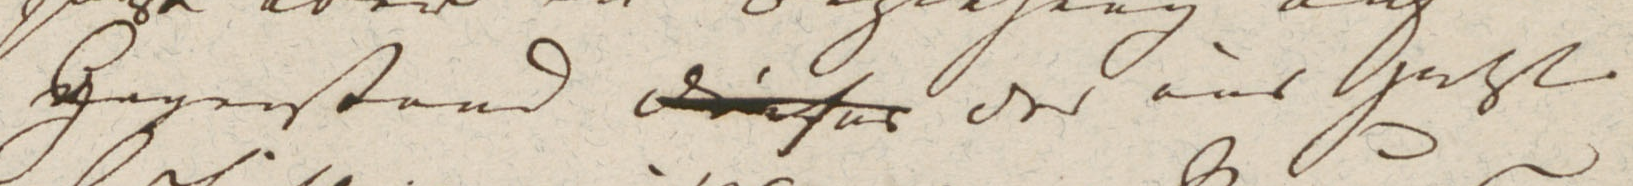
gGegenstand dieser der uns jetzt
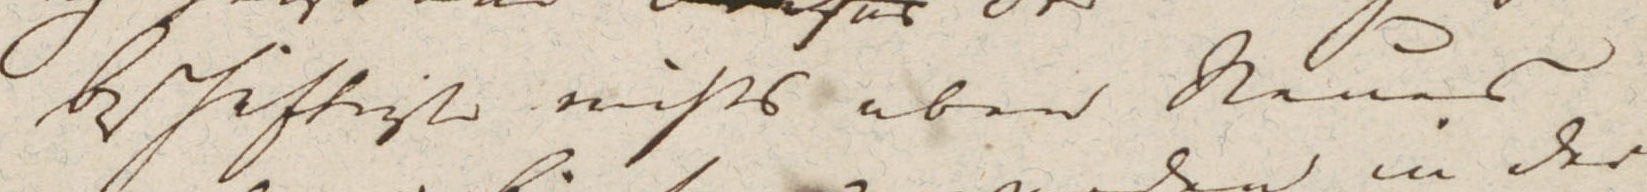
beschäftigt nichts eben Neues
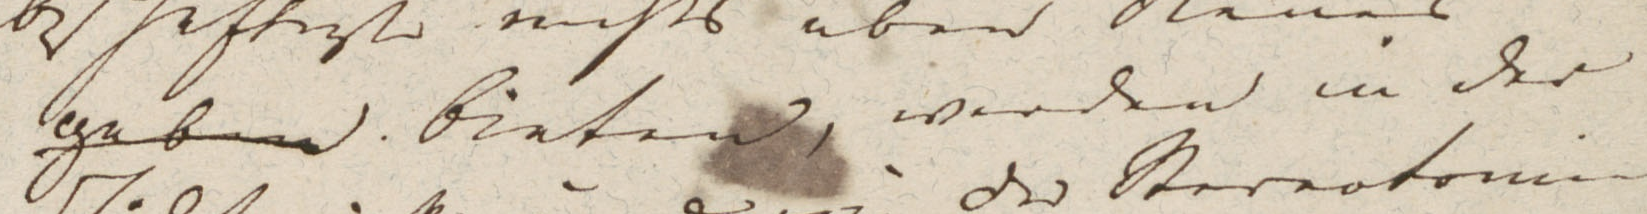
gaben bieten, werden in der
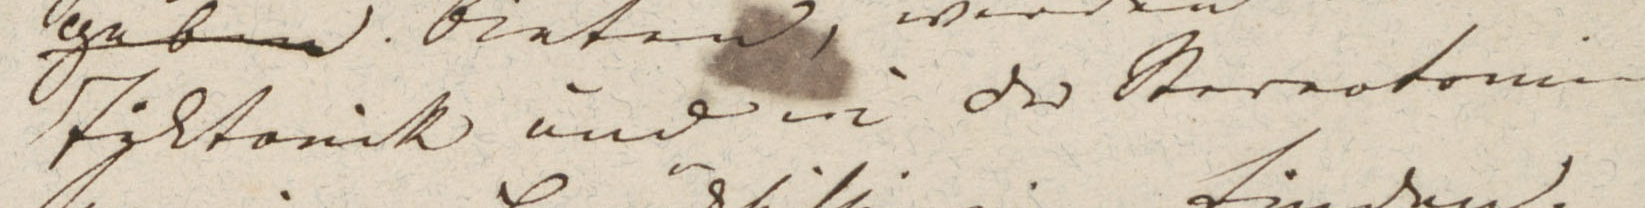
Tektonik und in der Stereotomie
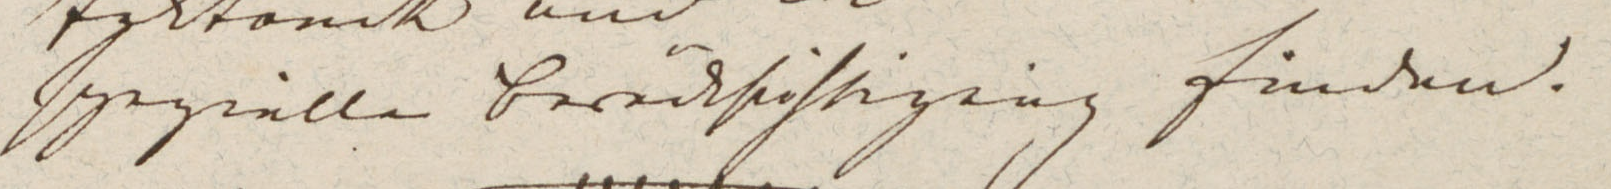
spezielle Berücksichtigung finden.
